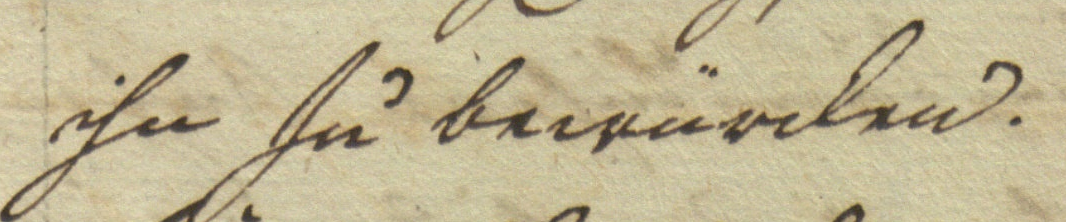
ihn zu bewürcken.
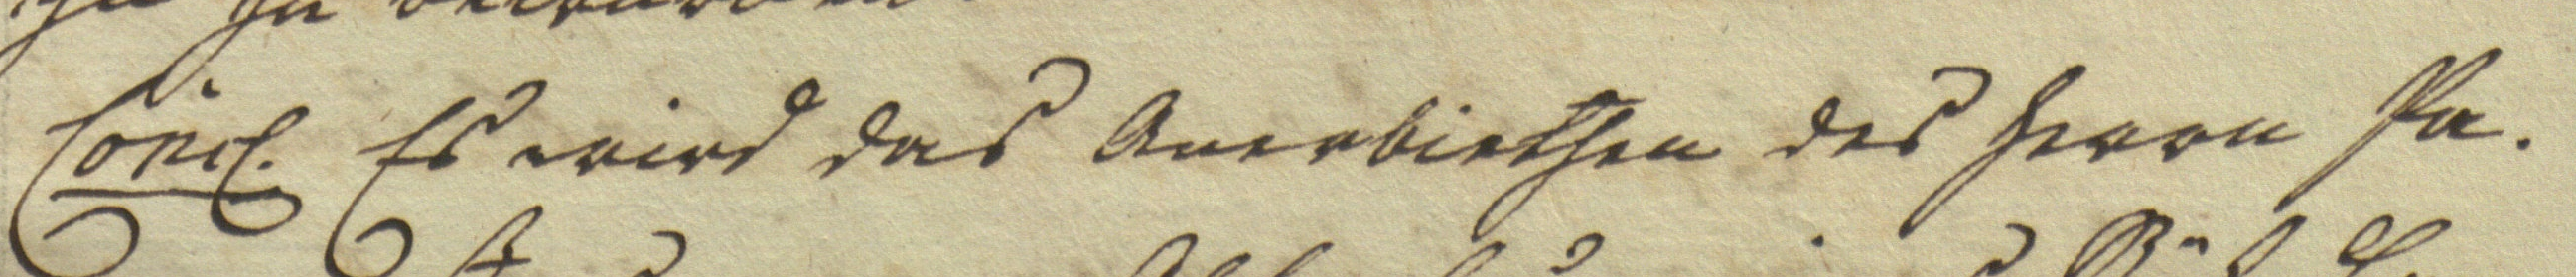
Concl. Es wird das Anerbiethen des Herrn Pa¬
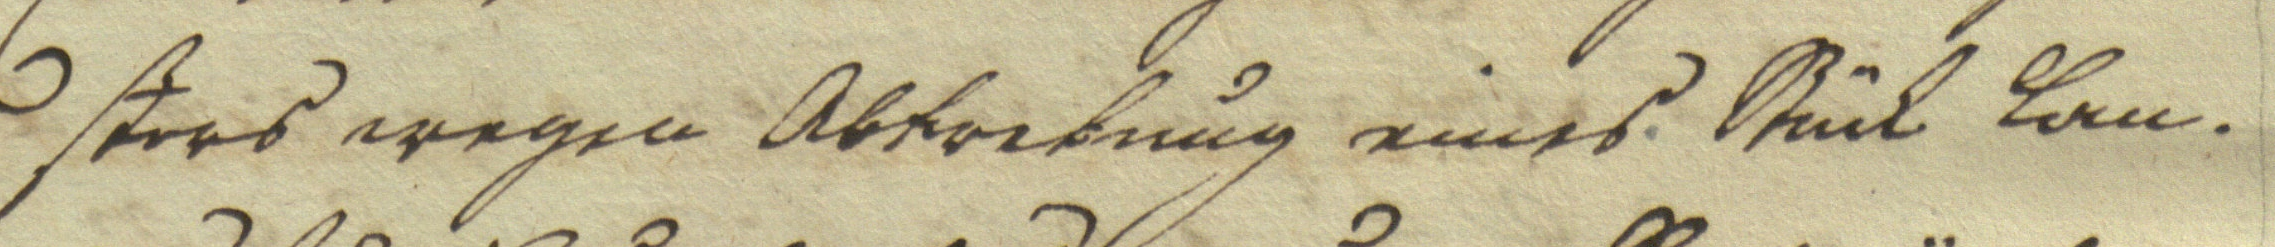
stors wegen Abtretung eines Stück Lan¬
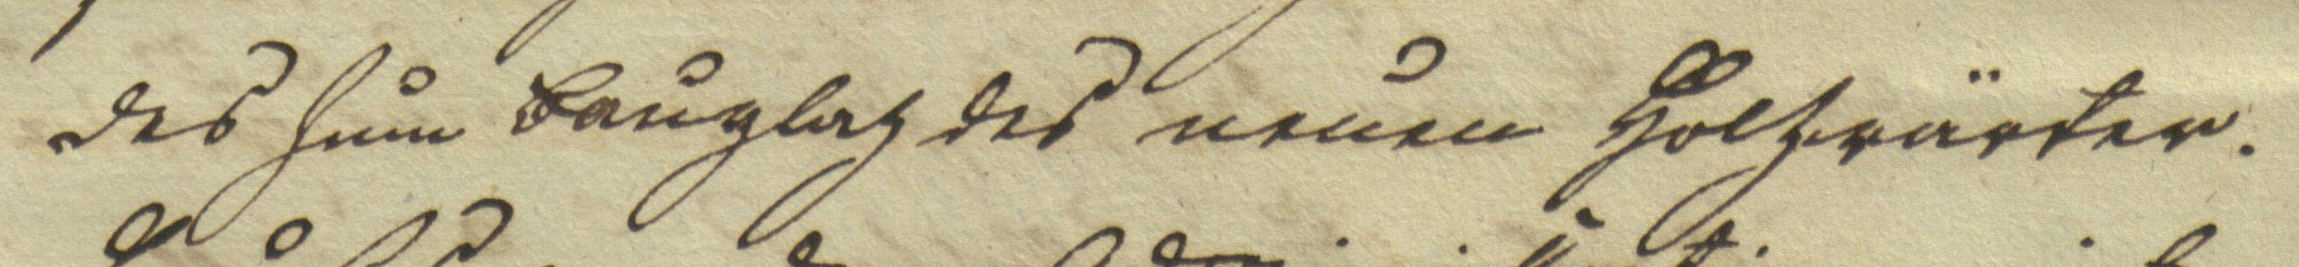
des zum Bauplatz des neuen Holzwärter¬
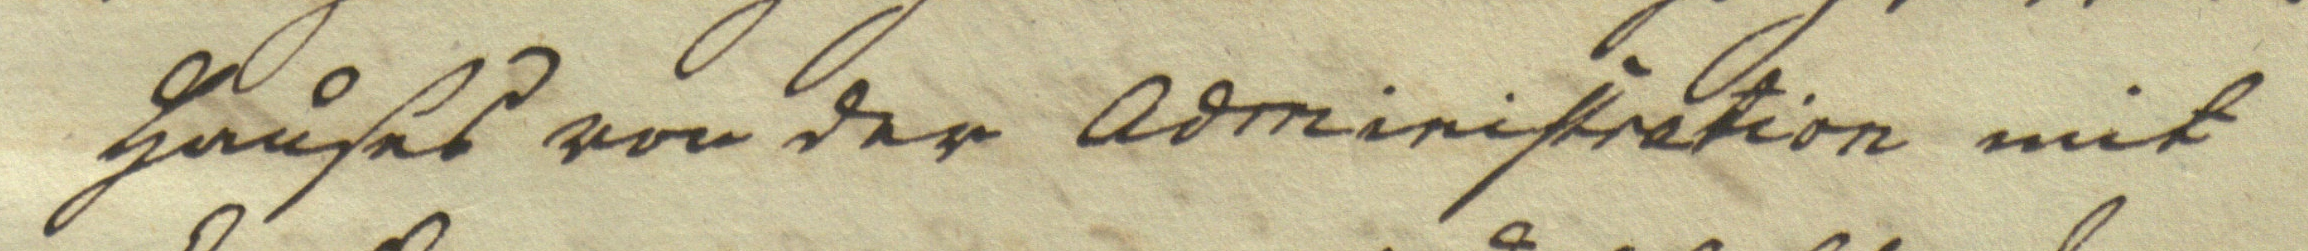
Hauses von der Administration mit
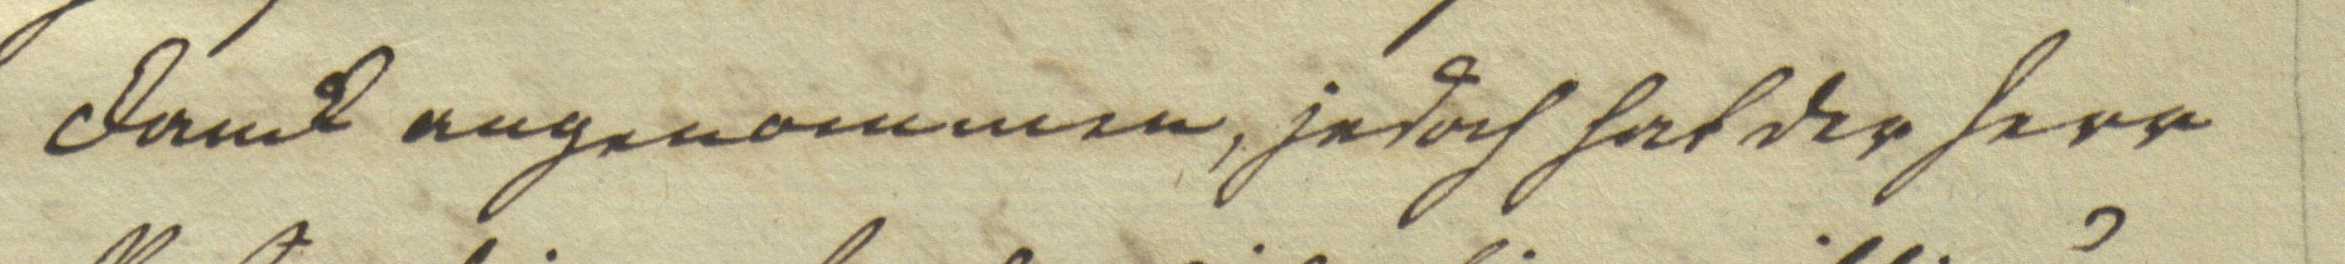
Danck angenommen, jedoch hat der Herr
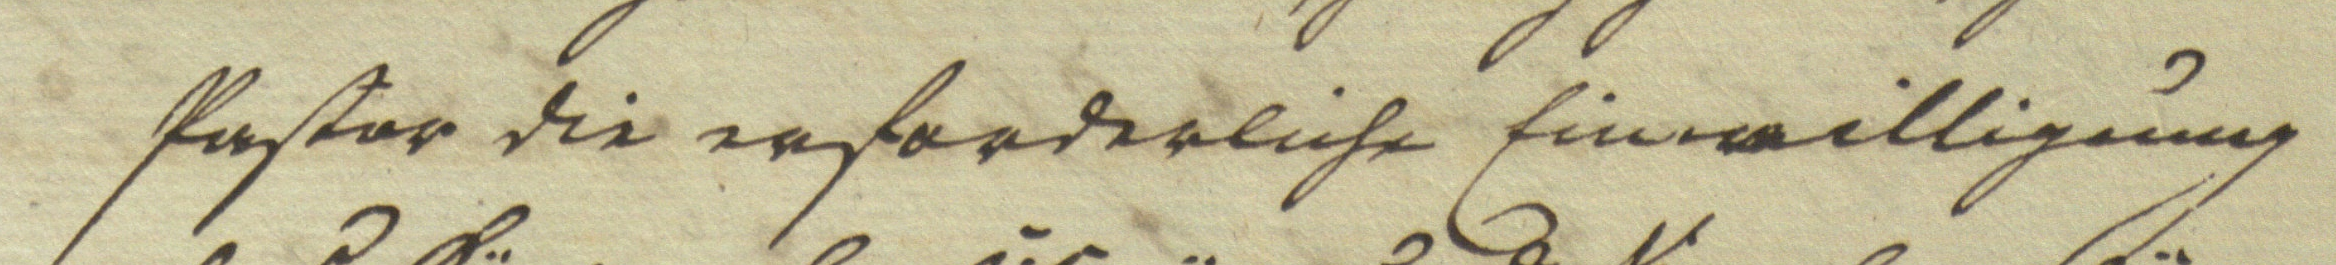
Pastor die erforderliche Einwilligung
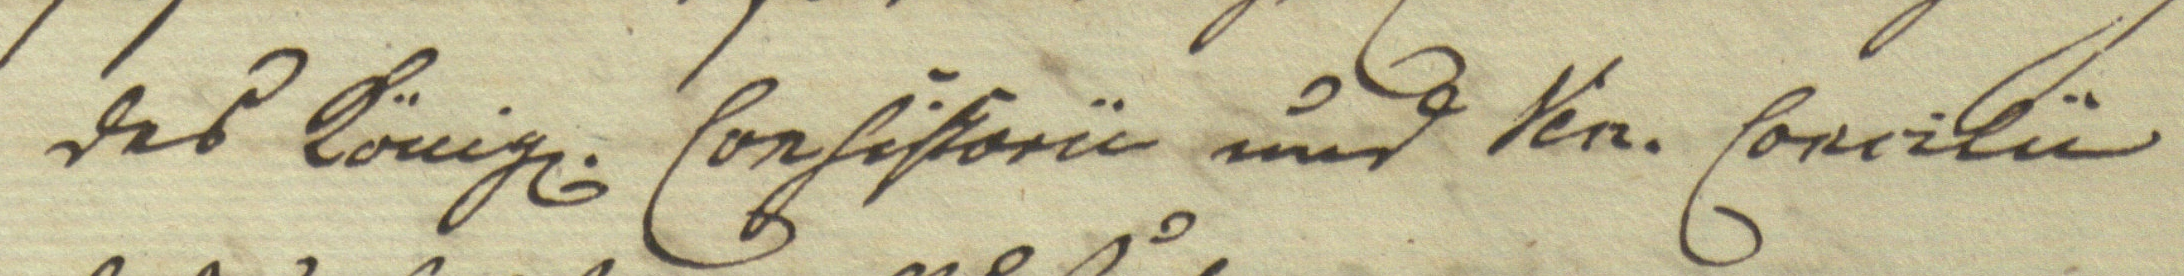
des Königl. Consistorii und Ven. Concilii¬
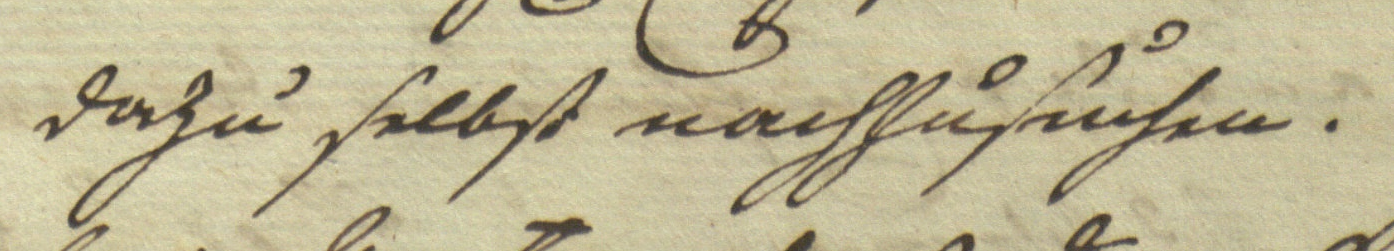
dazu selbst nachzusuchen.
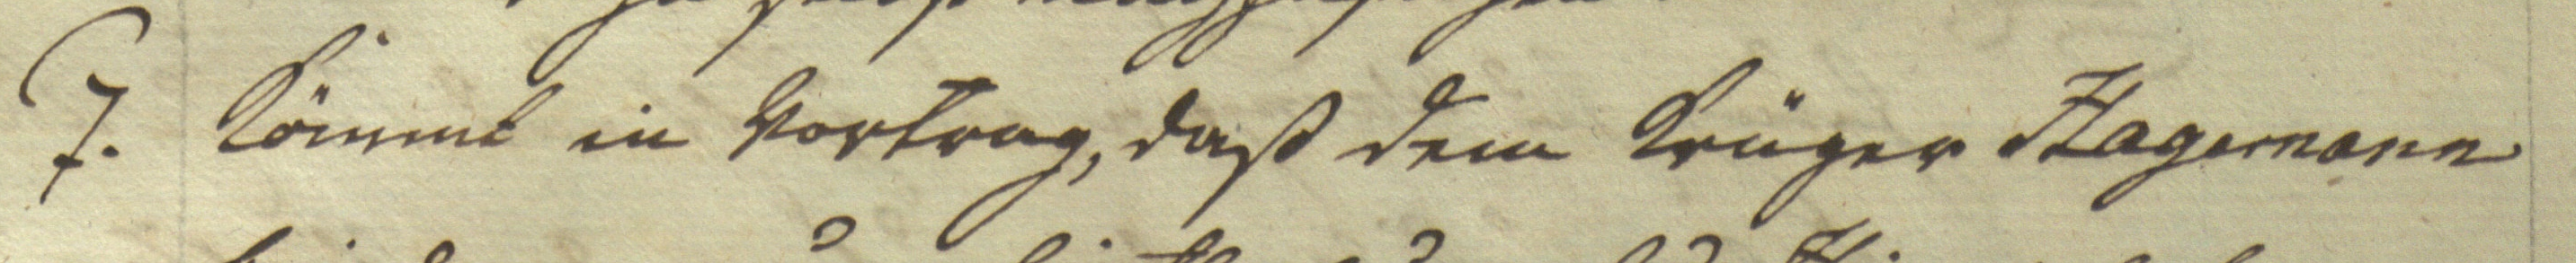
7. Kömmt in Vortrag, daß dem Krüger Hagemann
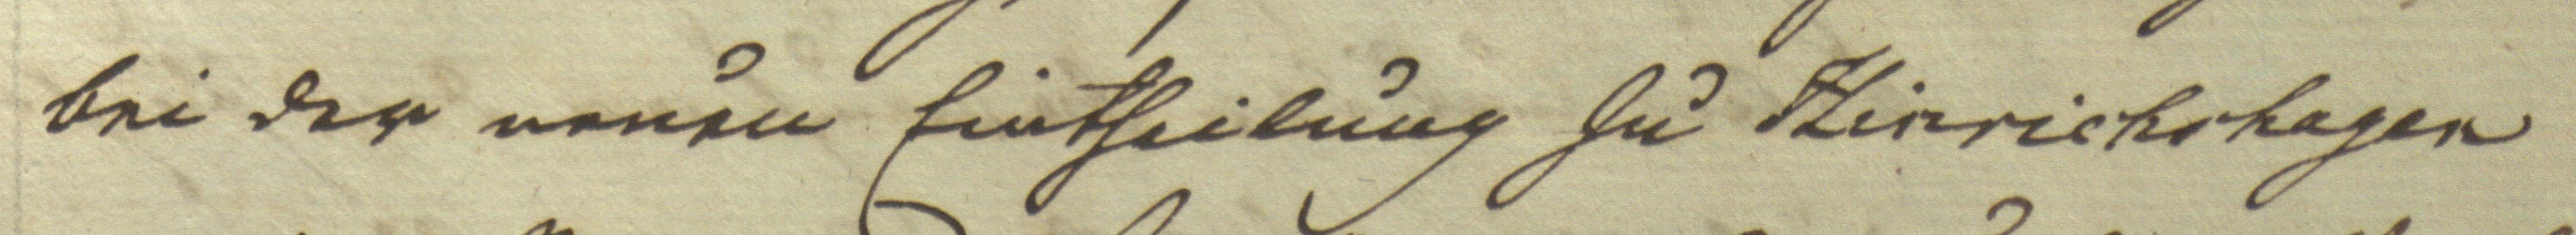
bei der neuen Eintheilung zu Hinrichshagen
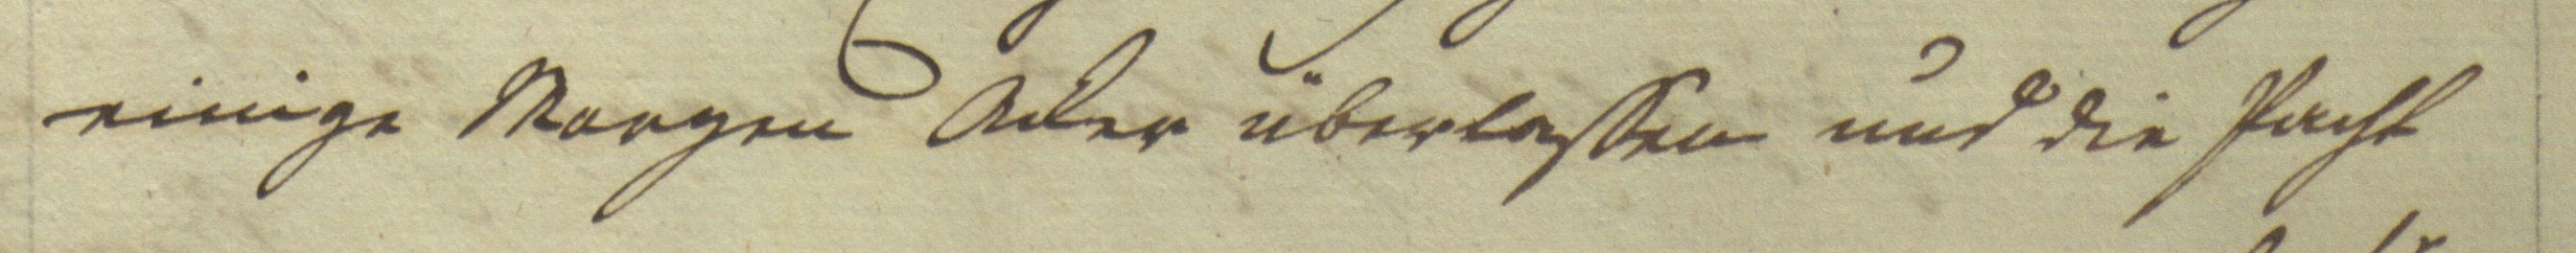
einige Morgen Acker überlassen und die Pacht
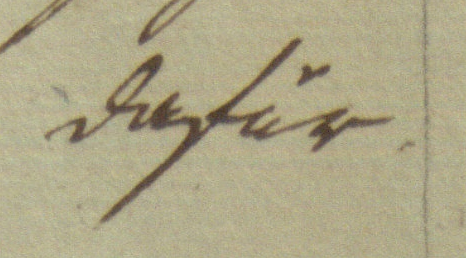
dafür
